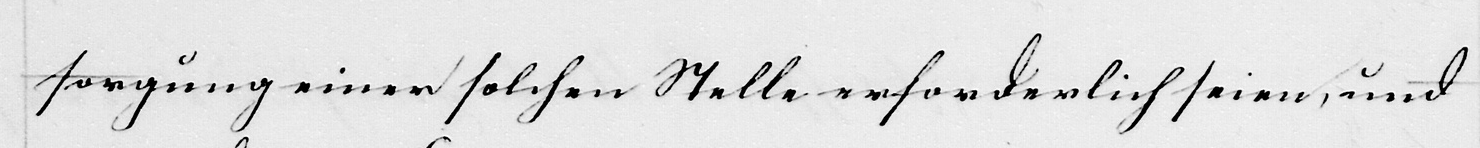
sorgung einer solchen Stelle erforderlich seien, und
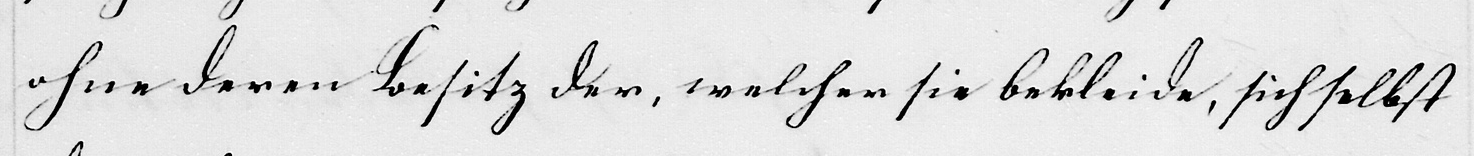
ohne deren Besitz der, welcher sie bekleide, sich selbst
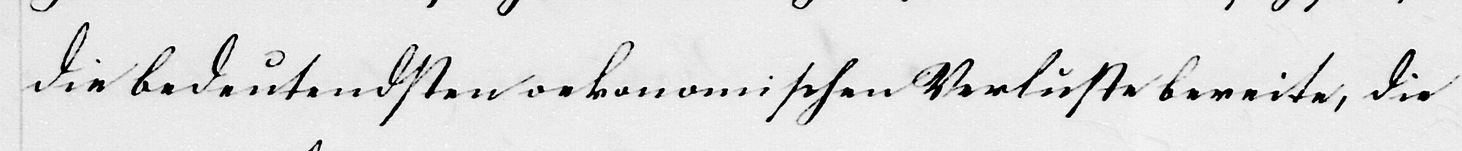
die bedeutendsten oekonomischen Verluste bereite, die
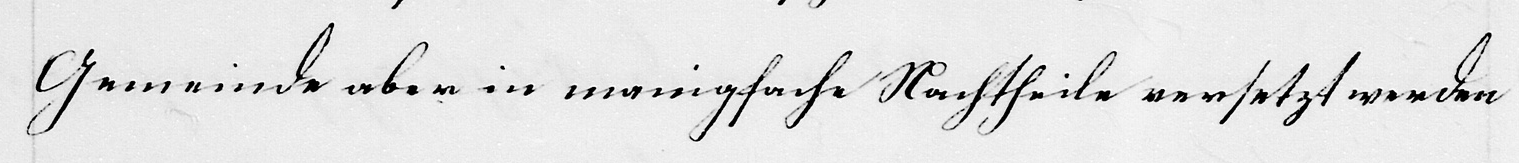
Gemeinde aber in manigfache Nachtheile versetzt werden
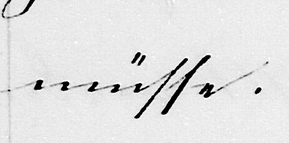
müsse.
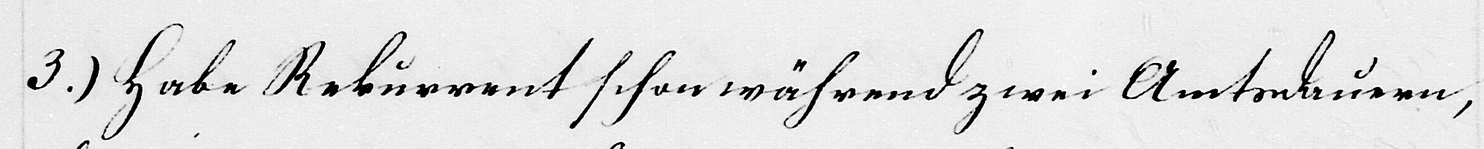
3.) Habe Rekurrent schon während zwei Amtsdauern,
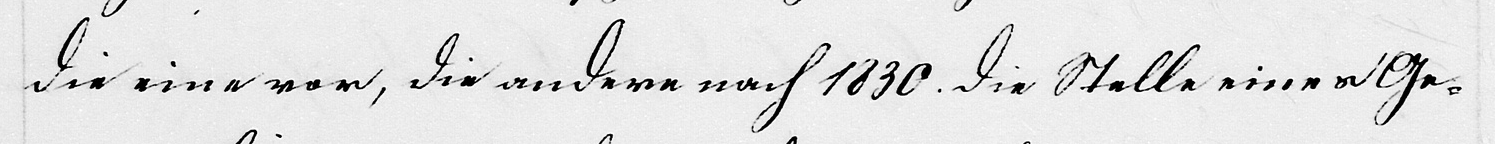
die eine vor, die andere nach 1830. die Stelle eines Ge¬
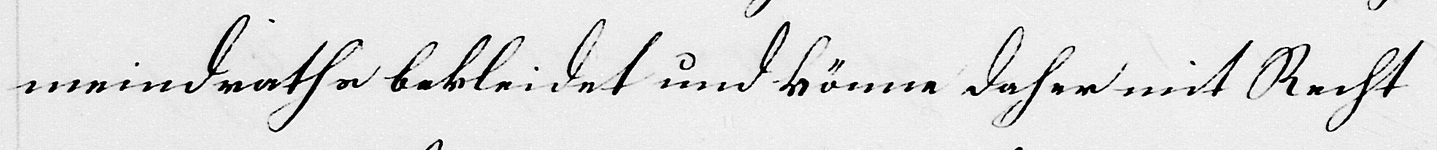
meindraths bekleidet und könne daher mit Recht
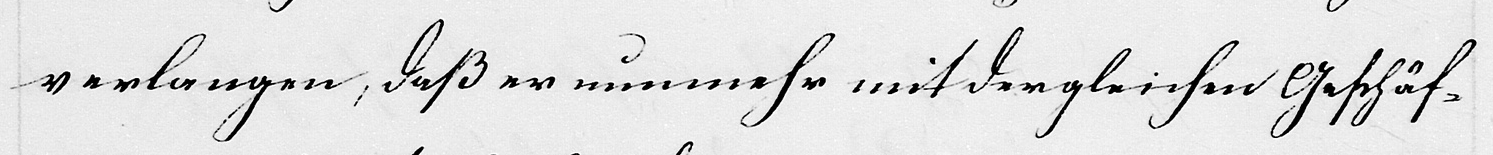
verlangen, daß er nunmehr mit dergleichen Geschäf¬
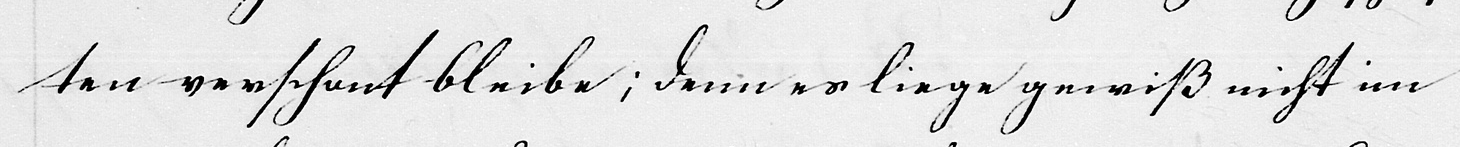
ten verschont bleibe; denn es liege gewiß nicht im
